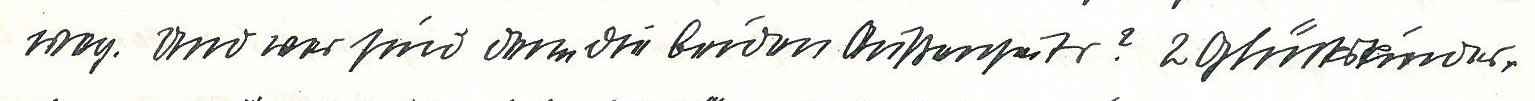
weg. Und wer sind denn die beiden Außenseiter? 2 Glückskinder,
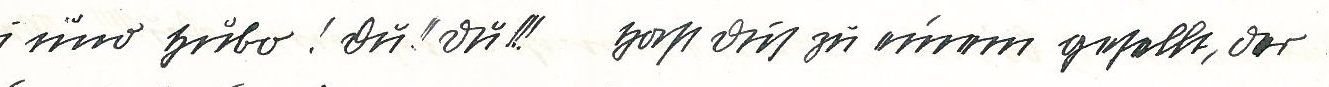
und Hubo! Du! Du!!! Hast Dich zu einem gesellt, der
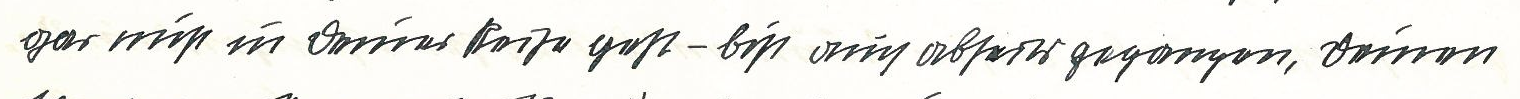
gar nicht in Deiner Reihe geht – bist auch abseits gegangen, Deinen
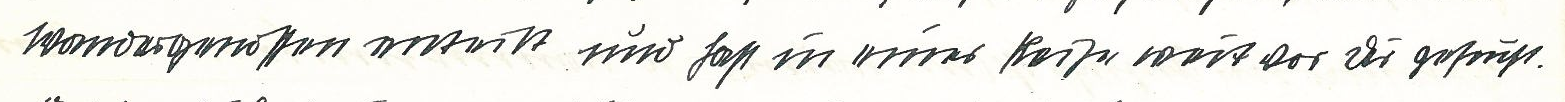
Wandergenossen enteilt und hast in einer Reihe weit vor Dir gesucht.
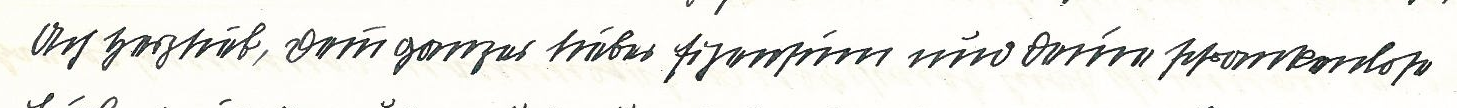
Ach Herzlieb, Dein ganzer lieber Eigensinn und Deine schrankenlose
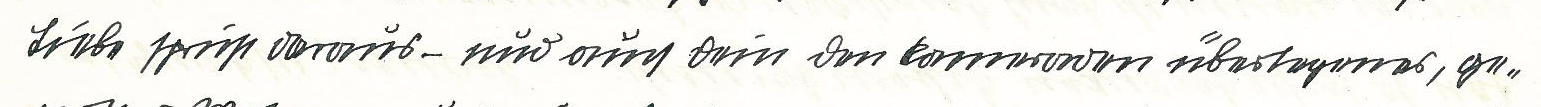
Liebe spricht daraus – und auch Dein den Kameraden überlegenes, ge¬
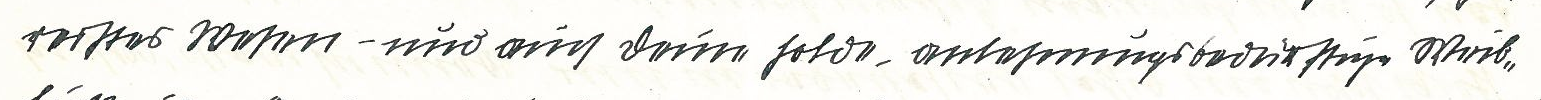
rechtes Wesen – und auch Deine holde, anlehnungsbedürftige Weib¬
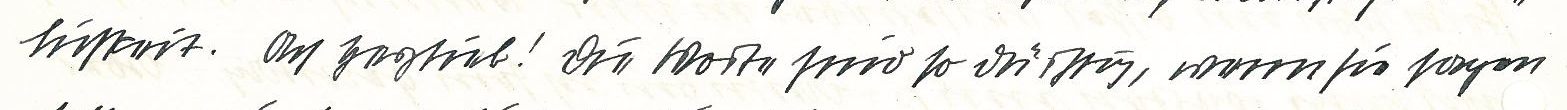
lichkeit. Ach Herzlieb! Die Worte sind so dürftig, wenn sie sagen
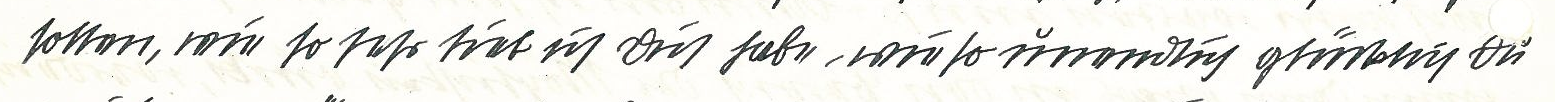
sollen, wie so sehr lieb ich Dich habe, wie so unendlich glücklich Du
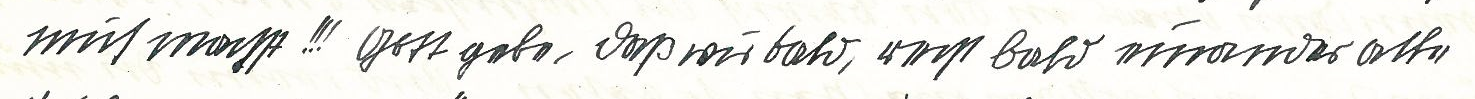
mich machst!! Gott gebe, daß wir bald, recht bald einander alle
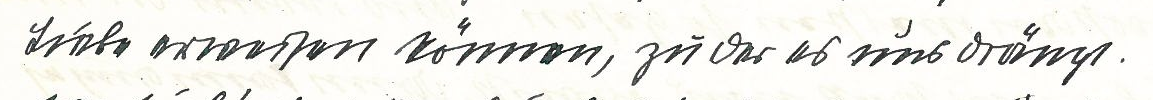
Liebe erweisen können, zu der es uns drängt.
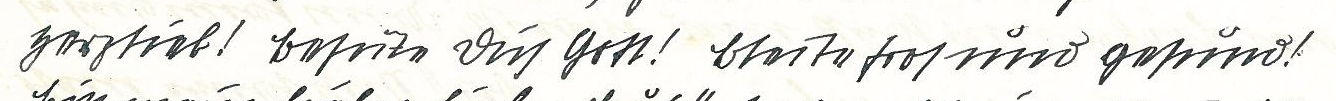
Herzlieb! Behüte Dich Gott! Bleibe froh und gesund!
